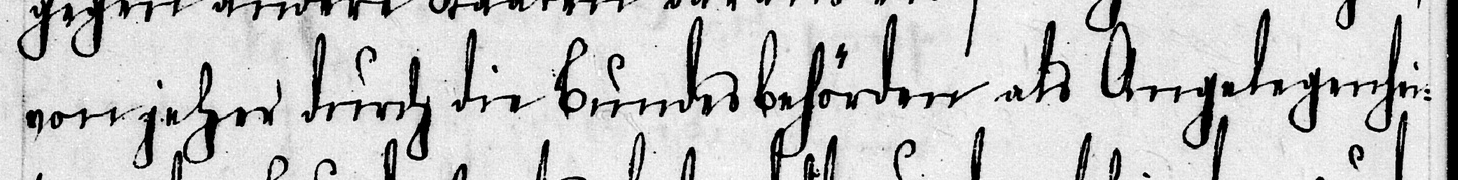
von jeher durch die Bundesbehörden als Angelegenhei¬
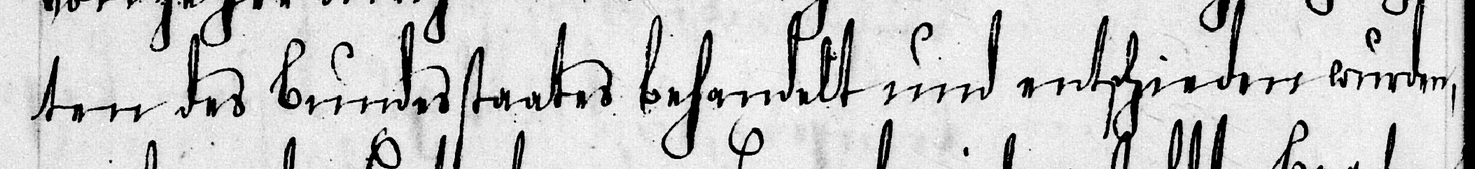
ten des Bundesstaates behandelt und entschieden wurden,
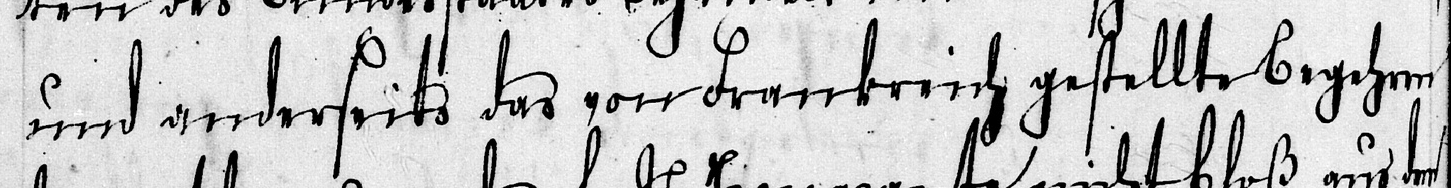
und anderseits das von Frankreich gestellte Begehren
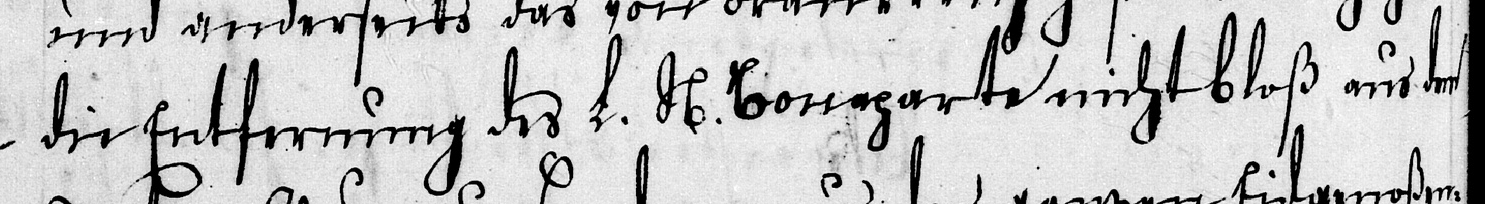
die Entfernung des L. N. Bonaparte nicht bloß aus dem
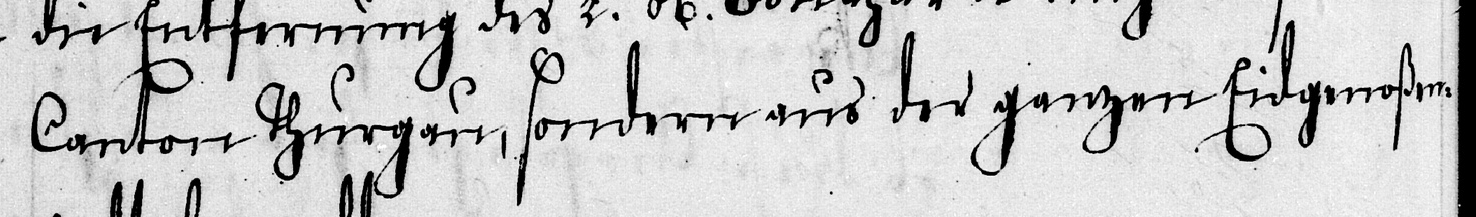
Canton Thurgau, sondern aus der ganzen Eidgenoßen¬
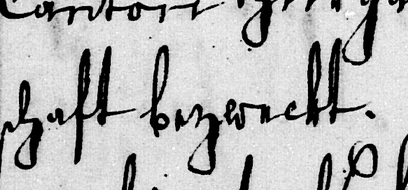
haft bezweckt.
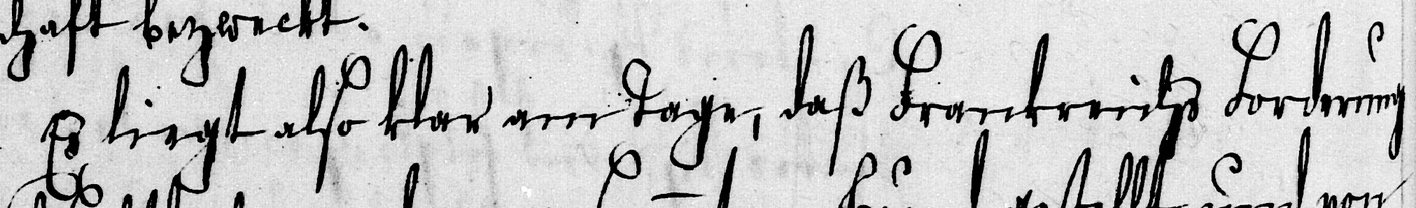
Es liegt also klar am Tage, daß Frankreichs Forderu¬
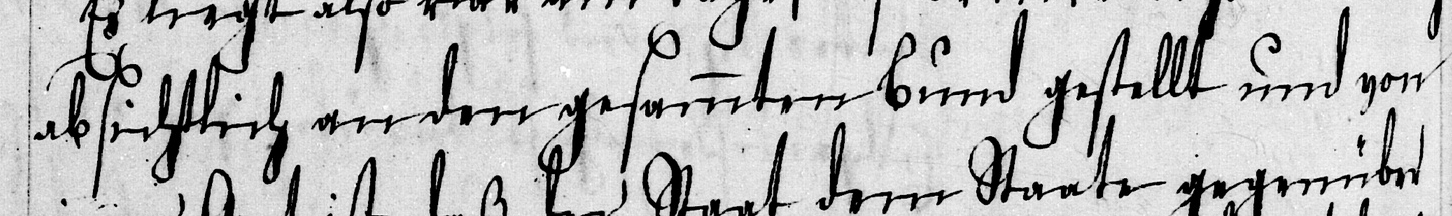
absichtlich an den gesammten Bund gestellt und von
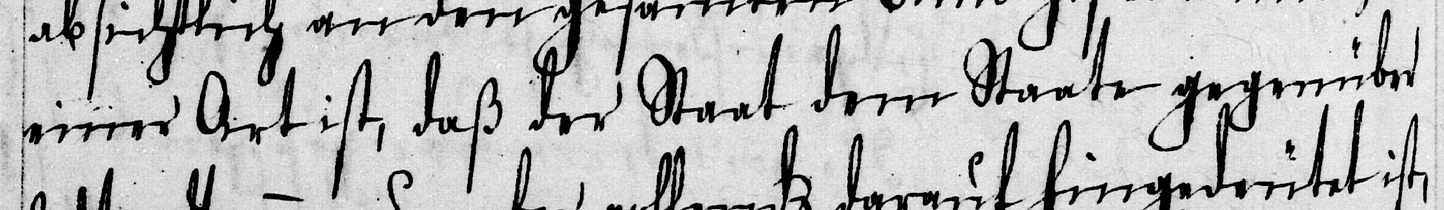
einer Art ist, daß der Staat dem Staate gegenüber
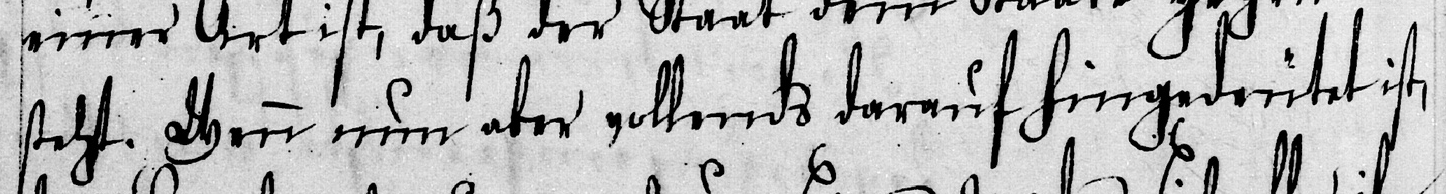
steht. Wenn nun aber vollends darauf hingedeutet ist,
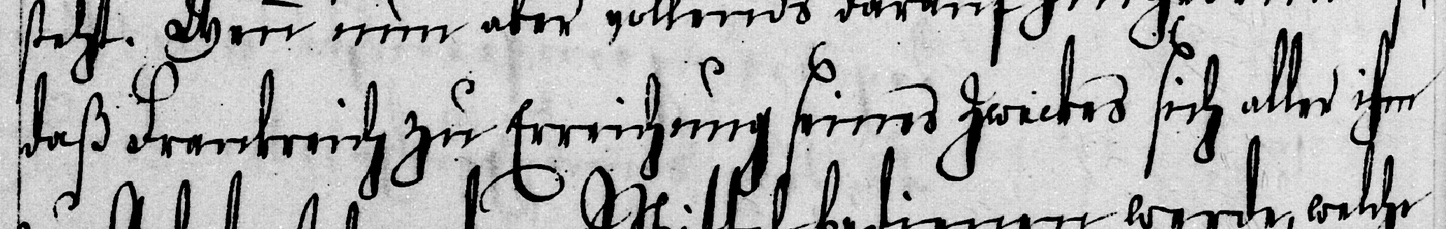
daß Frankreich zu Erreichung seines Zweckes sich aller ihm
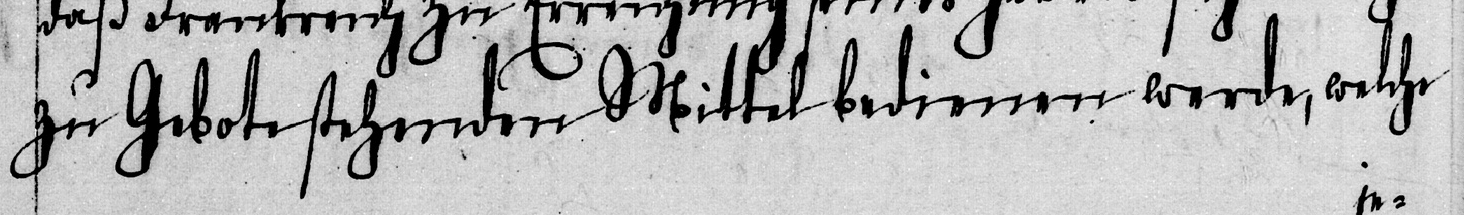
zu Gebote stehenden Mittel bedienen werde, welche
